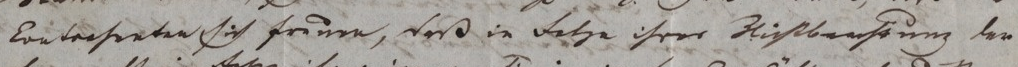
Contrahenten sich freuen, daß in Folge ihrer Nichtbeachtung der
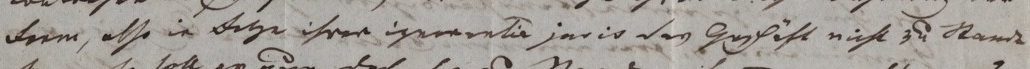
Form, also in Folge ihrer ignorantia juris das Geschäft nicht zu Stande
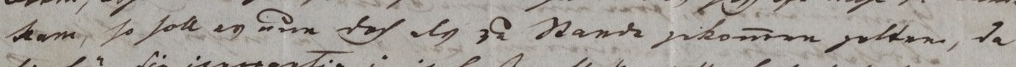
kam, so soll es nun doch als zu Stande gekommen gelten, da
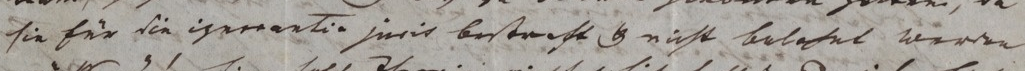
sie für die ignorantia juris bestraft & nicht belohnt werden
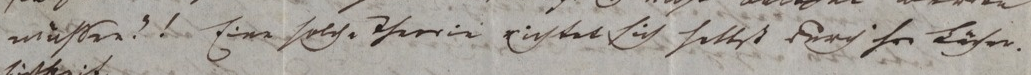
müssen.»! Eine solche Theorie richtet sich selbst durch ihre Lächer-
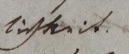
lichkeit.
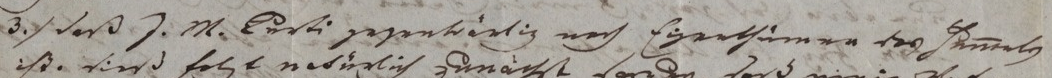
3.) Daß J. M. Curti gegenwärtig noch Eigenthümer des Hummels
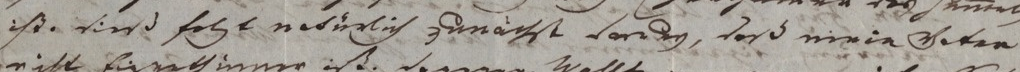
ist, dieß setzt natürlich zunächst voraus, daß mein Vater
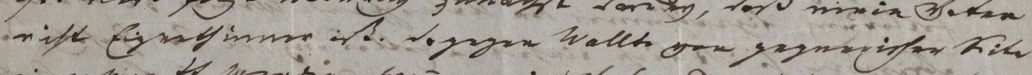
nicht Eigenthümer ist. Dagegen wollte von gegnerischer Seite
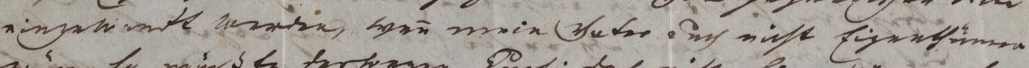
eingewandt werden, wenn mein Vater auch nicht Eigenthümer
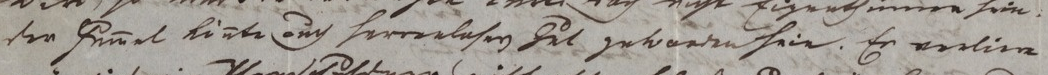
Der Hummel könnte auch herrenloses Gut geworden sein. Es verliere
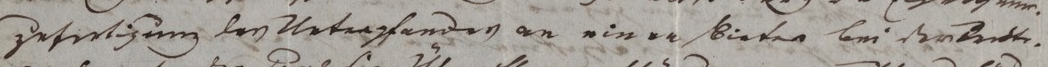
zufertigung des Unterpfandes an einen Bieter bei der Rechts-
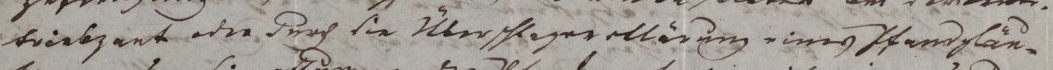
triebgant oder durch die Überschlagserklärung eines Pfandgläu-
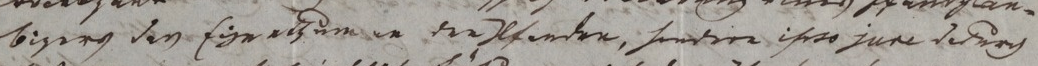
bigers das Eigenthum an den Pfanden, sondern ipso jure dadurch
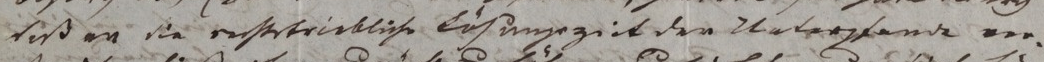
daß er die rechtstriebliche Lösungszeit der Unterpfande ver-
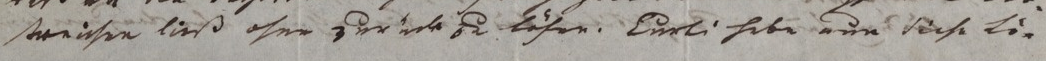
streichen ließ ohne zurück zu lösen. Curti habe nun diese Lö-
